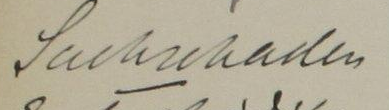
Sachschaden
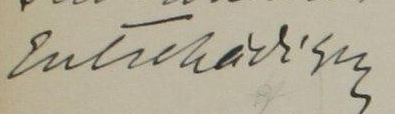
Entschädigung
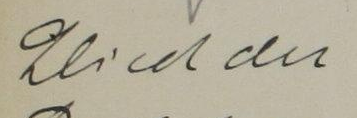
Glied der
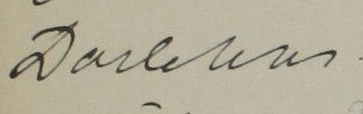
Darlehns
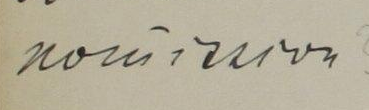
kommission
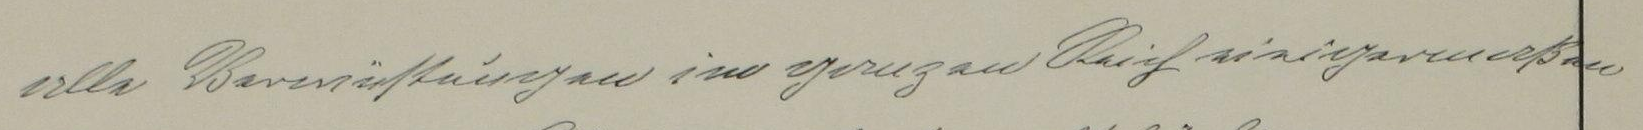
alle Verwüstungen im ganzen Reich einigermaßen
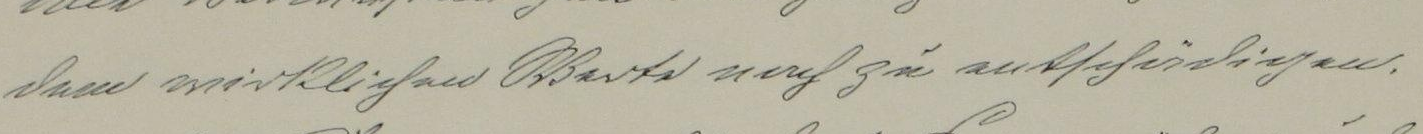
dem wirklichen Werte nach zu entschädigen.
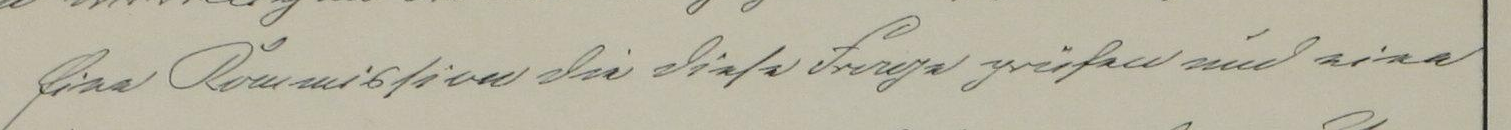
Eine Kommission die diese Frage prüfen und eine
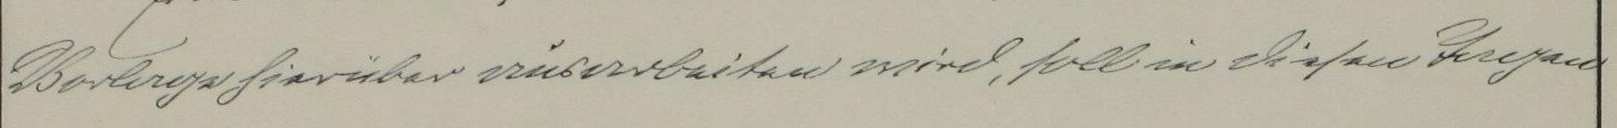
Vorlage hierüber ausarbeiten wird, soll in diesen Tagen
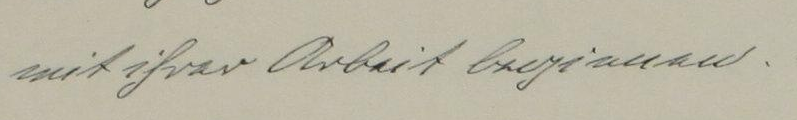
mit ihrer Arbeit beginnen.
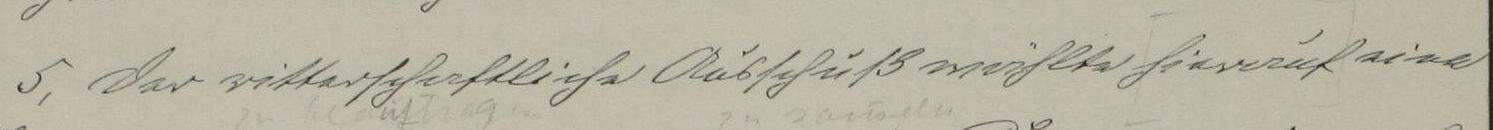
5. Der ritterschaftliche Ausschuß wählte hierauf eine
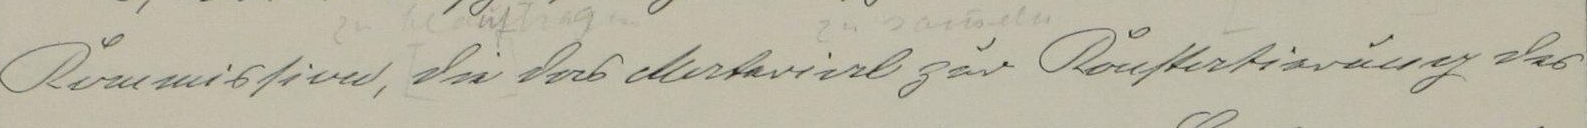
Kommission, die das Material zur Konstatierung des
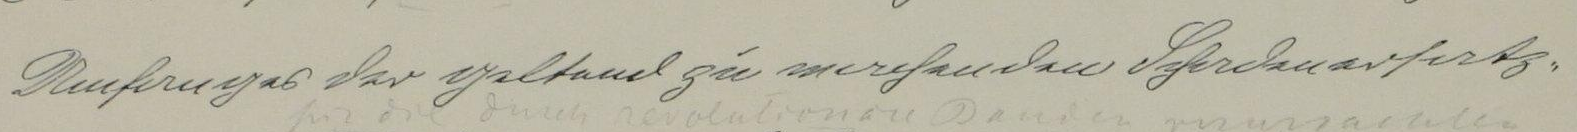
Umfanges der geltend zu machenden Schadenersatz-
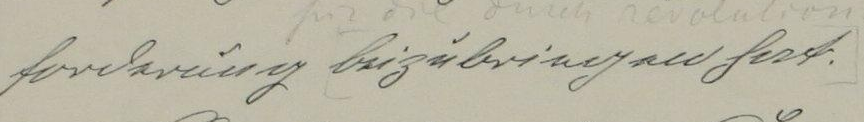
forderung beizubringen hat.
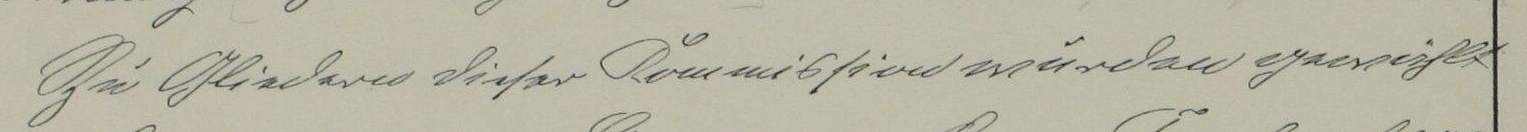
Zu Gliedern dieser Kommission wurden gewählt
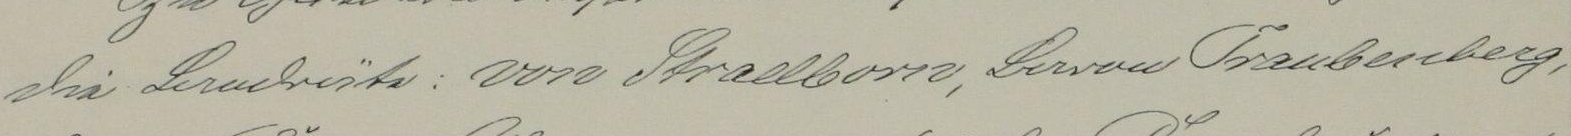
die Landräte: von Straelborn, Baron Traubenberg,
